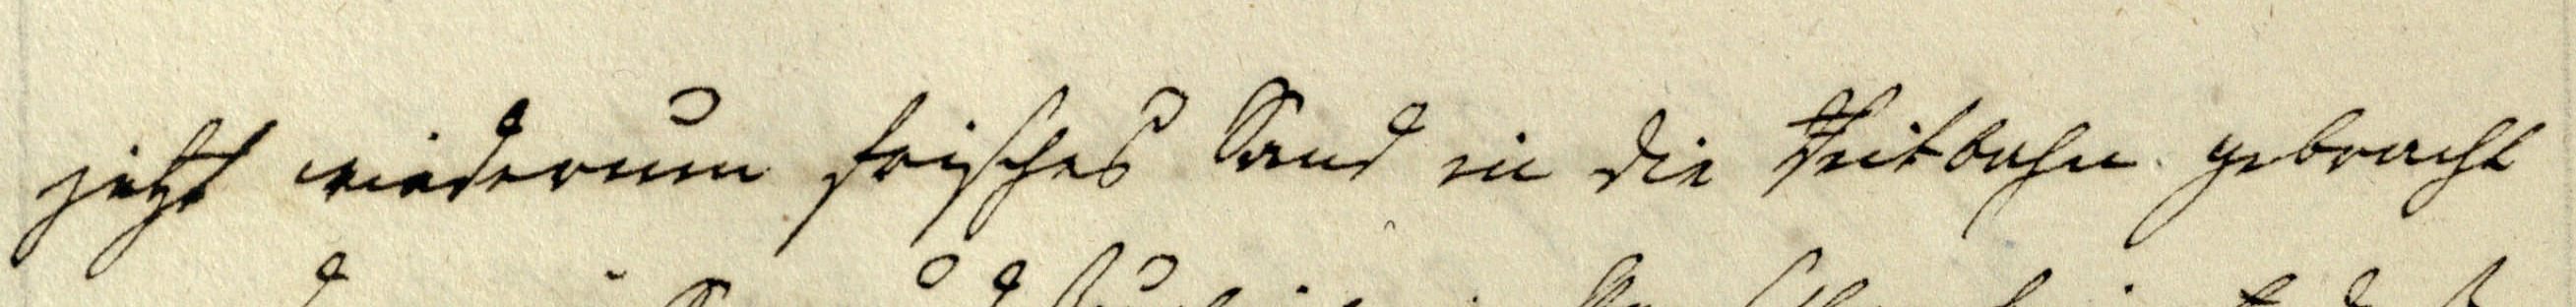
jetzt wiederum frischer Sand in die Reitbahn gebracht
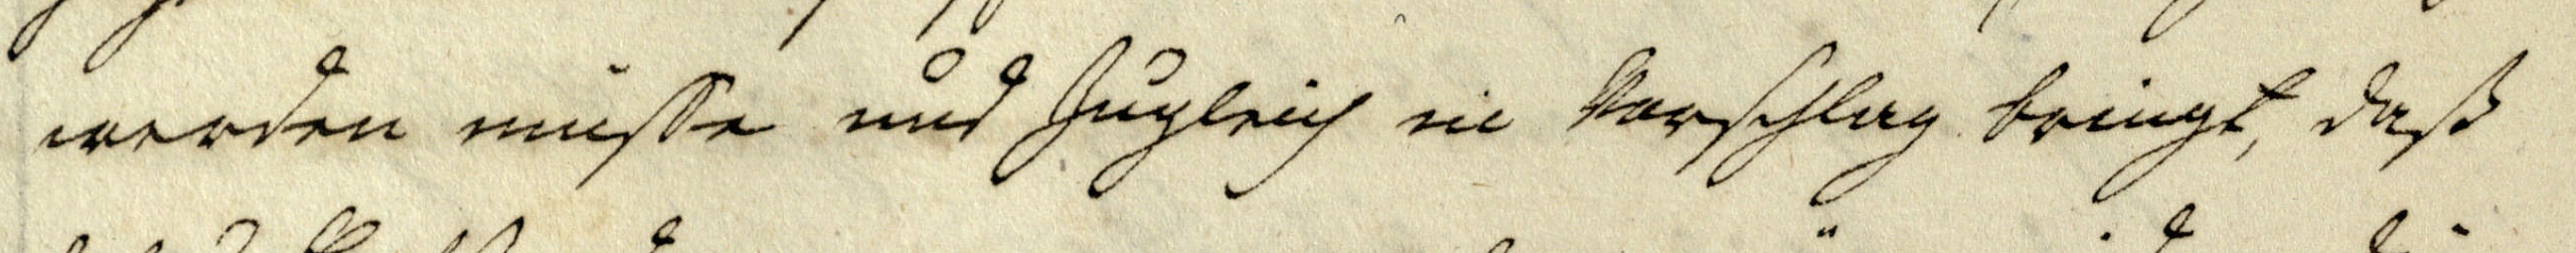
werden müsse und zugleich in Vorschlag bringt, daß
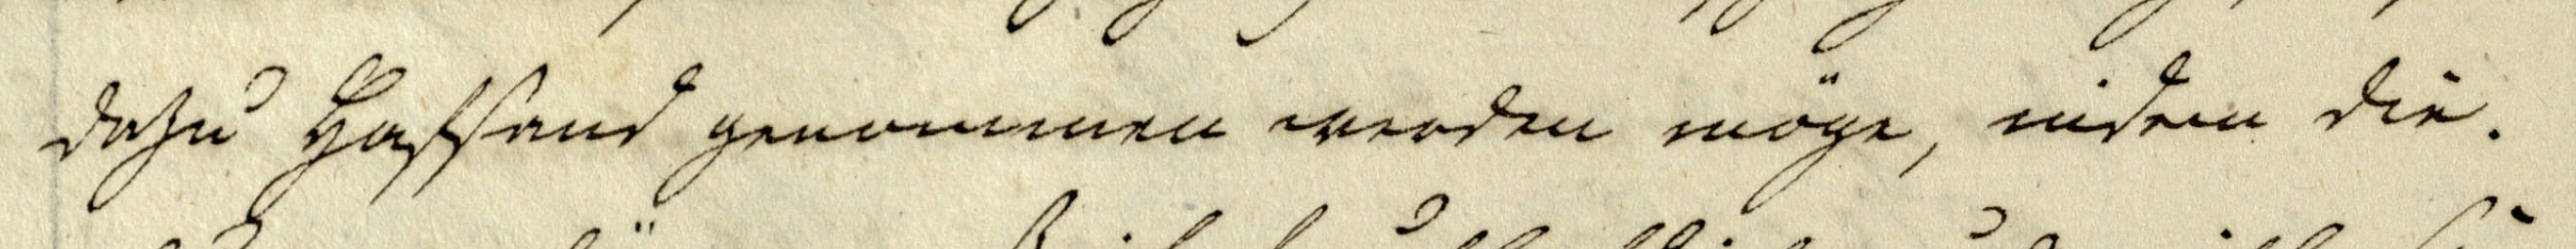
dazu Hafsand genommen werden möge, indem die¬
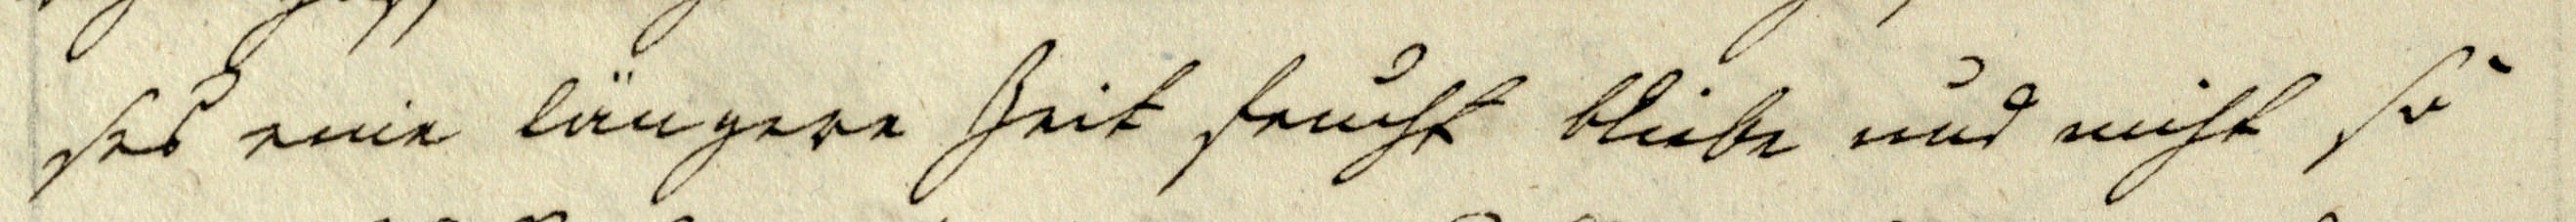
ses eine längere Zeit feucht bleibe und nicht so
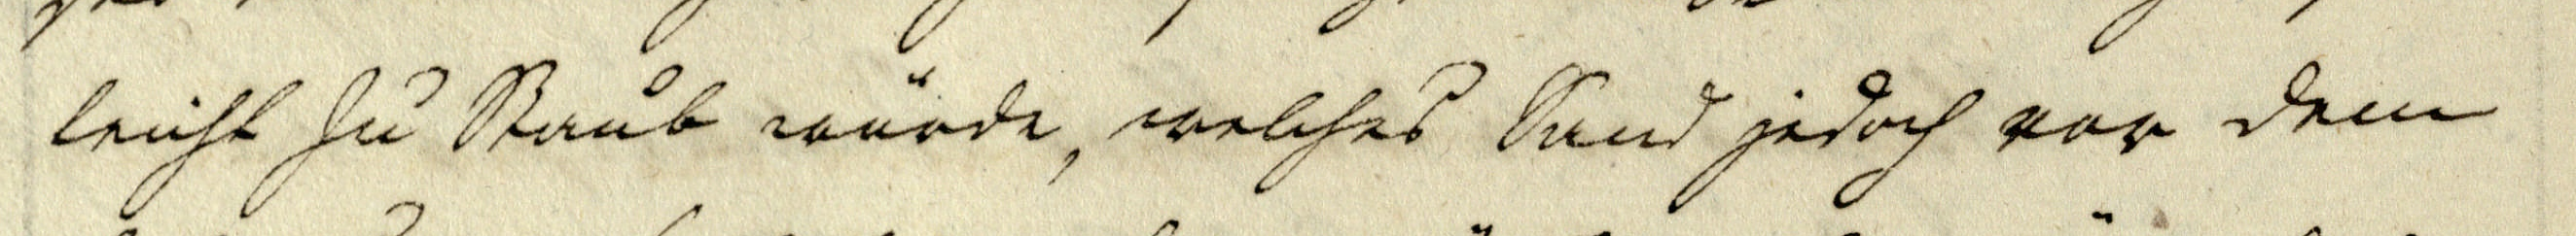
leicht zu Staub würde, welcher Sand jedoch vor dem
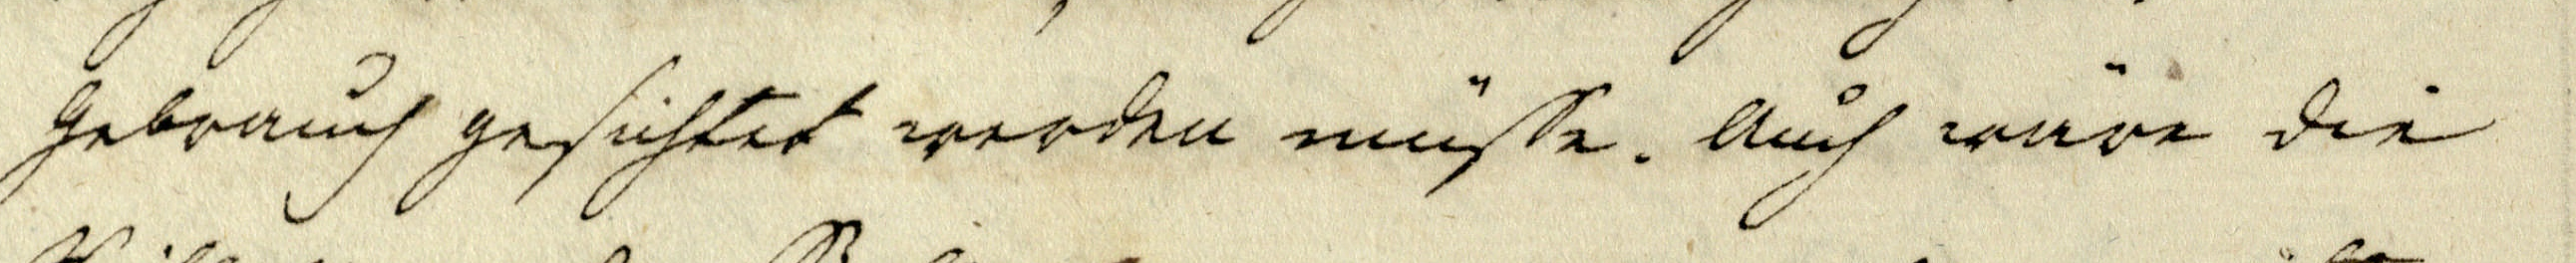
Gebrauch gesichtet werden müsse. Auch wäre die
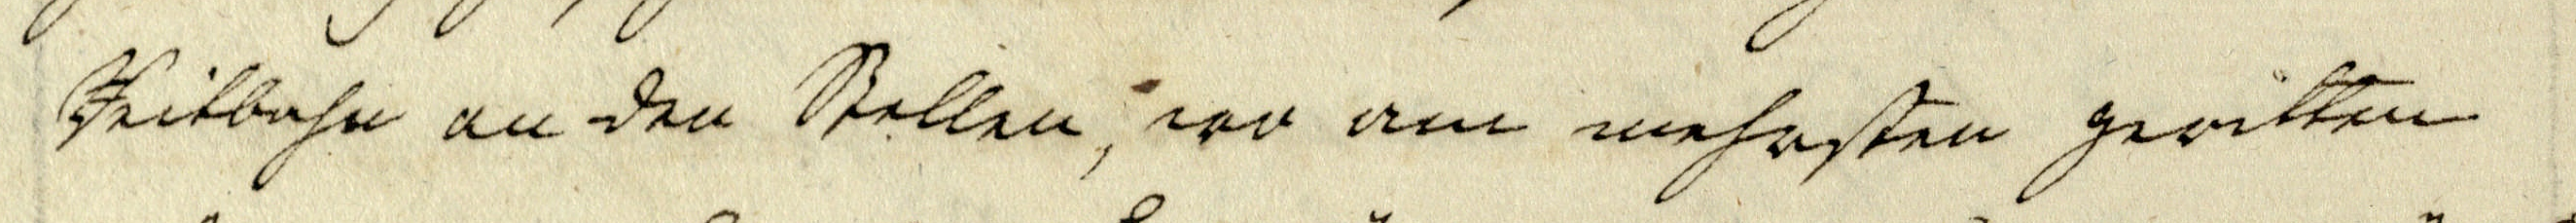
Reitbahn an den Stellen, wo am mehrsten geritten
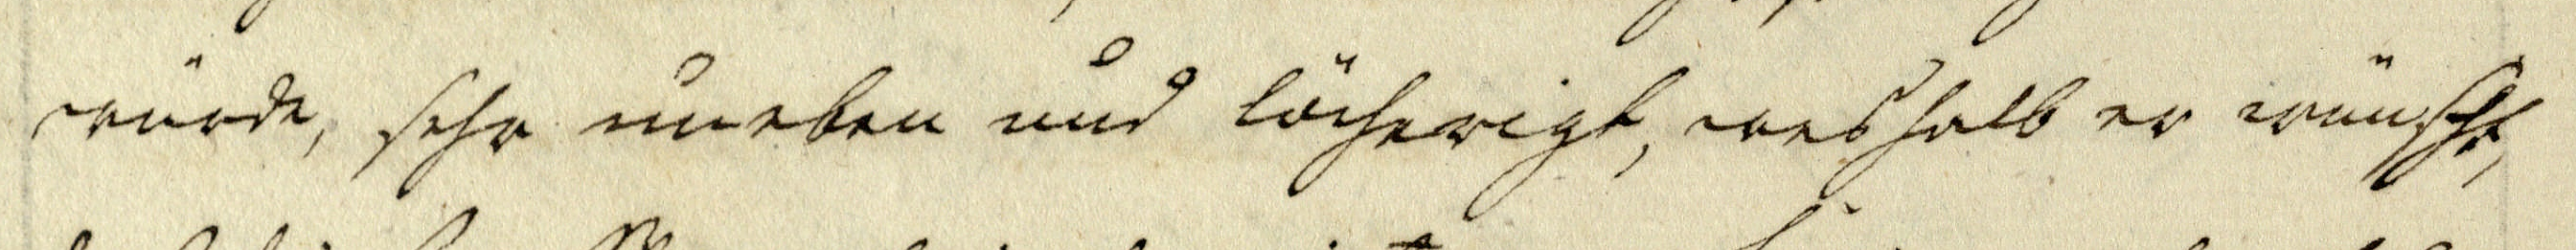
würde, sehr uneben und löcherigt, weshalb er wünscht,
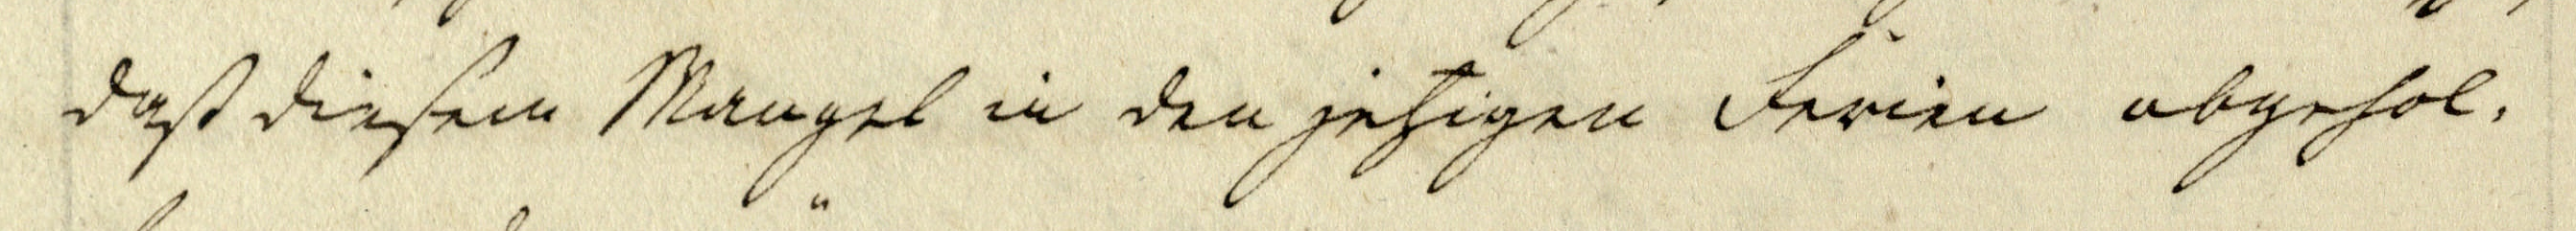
daß diesem Mangel in den jetzigen Ferien abgehol¬
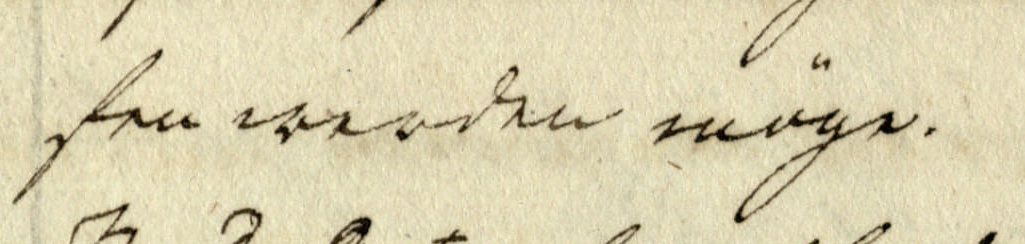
fen werden möge.
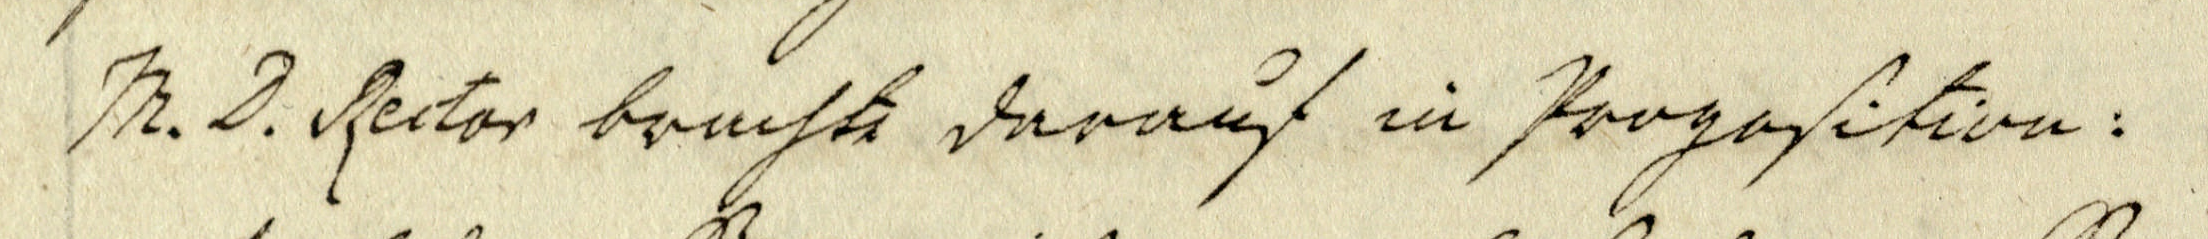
M. D. Rector brachte darauf in Proposition:
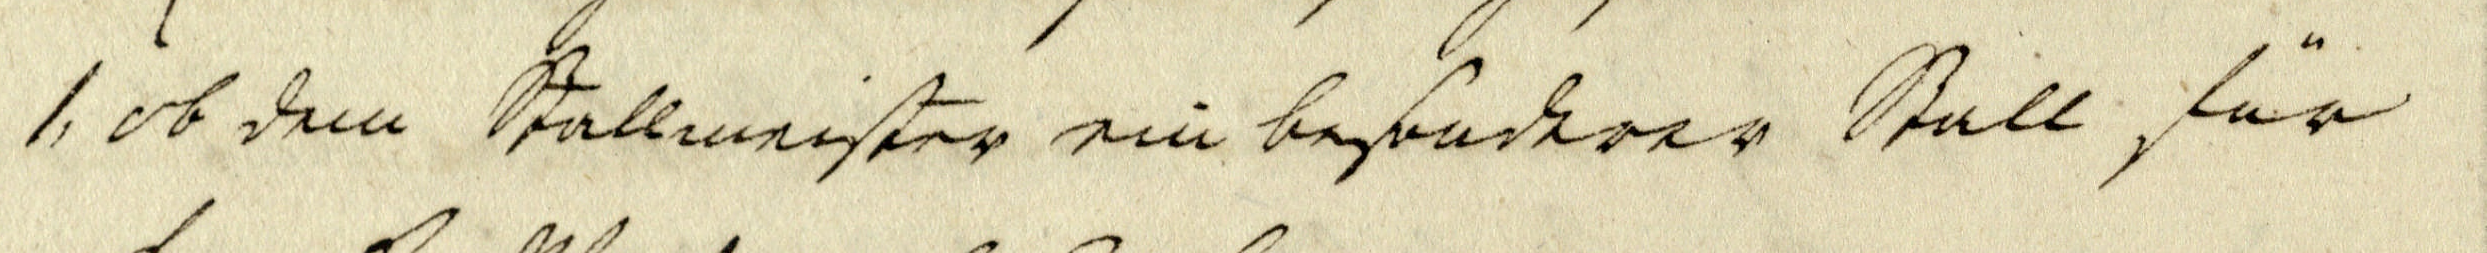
1, ob dem Stallmeister ein besonderer Stall für
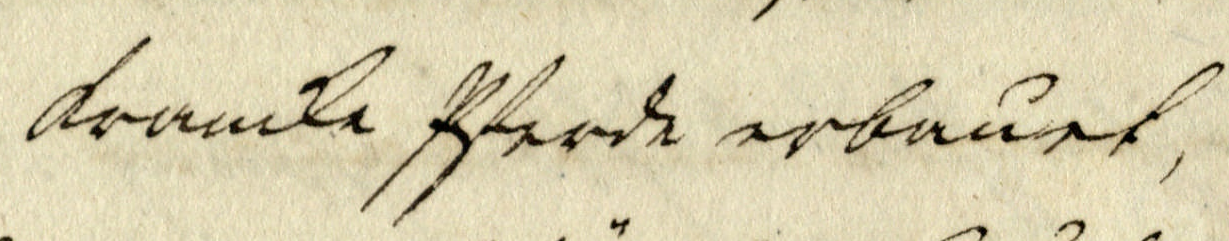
krancke Pferde erbauet,
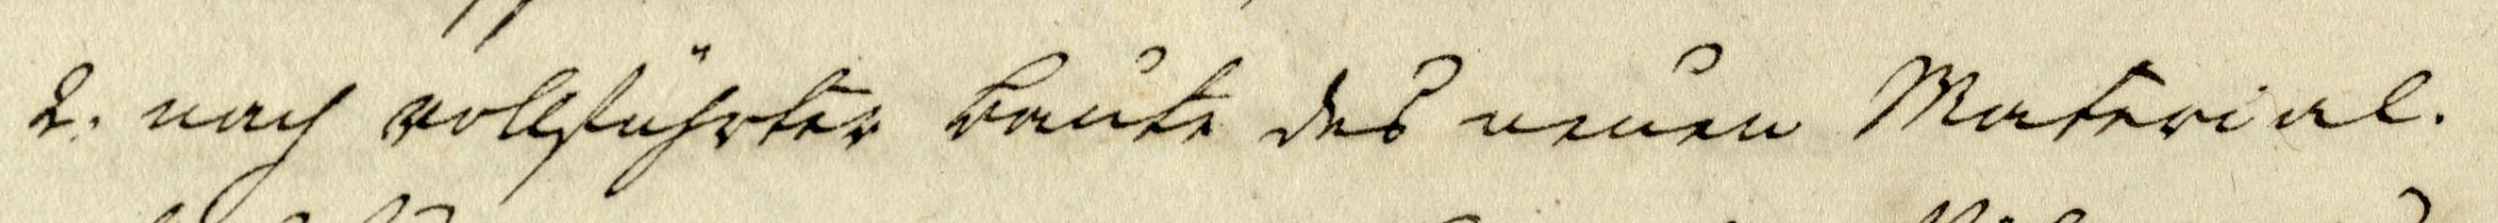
2. nach vollführter Baute des neuen Material¬
